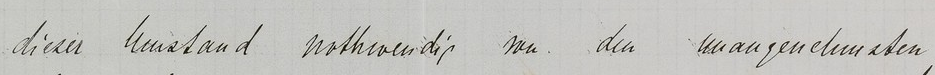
dieser Umstand nothwendig von den unangenehmsten
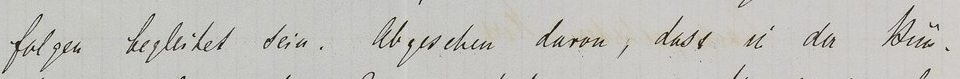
Folgen begleitet sein. Abgesehen davon, dass in der Bun-
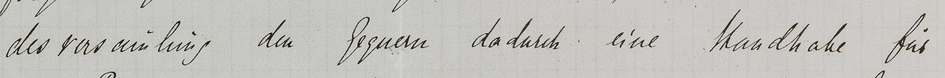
desversammlung den Gegnern dadurch eine Handhabe für
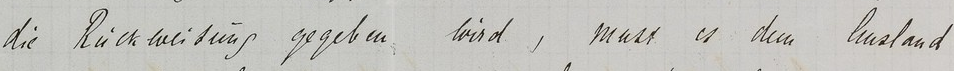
die Rückweisung gegeben wird, muss es dem Ausland
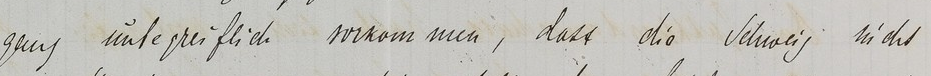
ganz unbegreiflich vorkommen, dass die Schweiz nicht
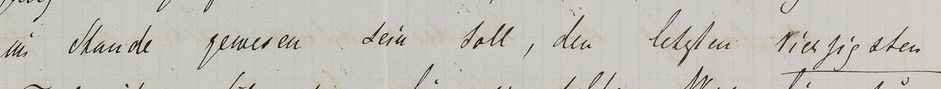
im Stande gewesen sein soll, den letzten vierzigsten
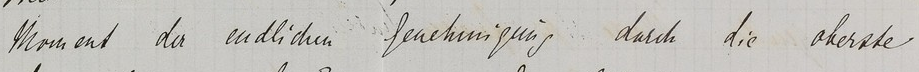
Moment der endlichen Genehmigung durch die oberste
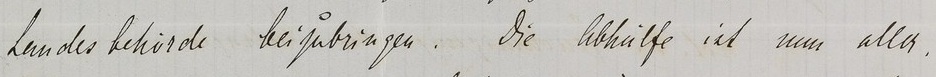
Landesbehörde beizubringen. Die Abhülfe ist nun aller-
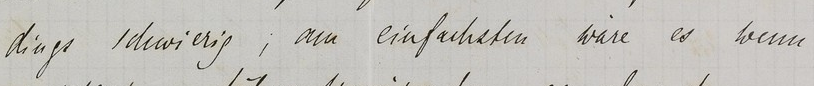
dings schwierig; am einfachsten wäre es wenn
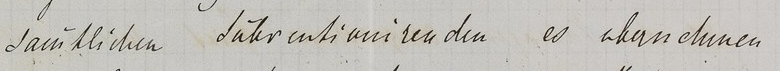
sämmtlichen Subventionirenden es übernehmen
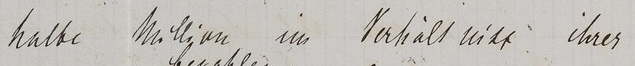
halbe Million im Verhältnisse ihrer
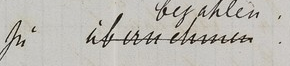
zu übernehmenbezahlen.
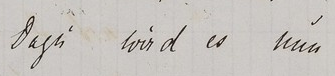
Dazu wird es nun
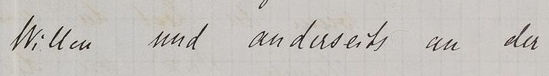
Willen und anderseits an der
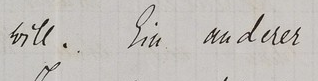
will. Ein anderer
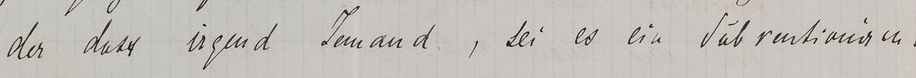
der dass irgend jemand, sei es ein Subventioniren-
